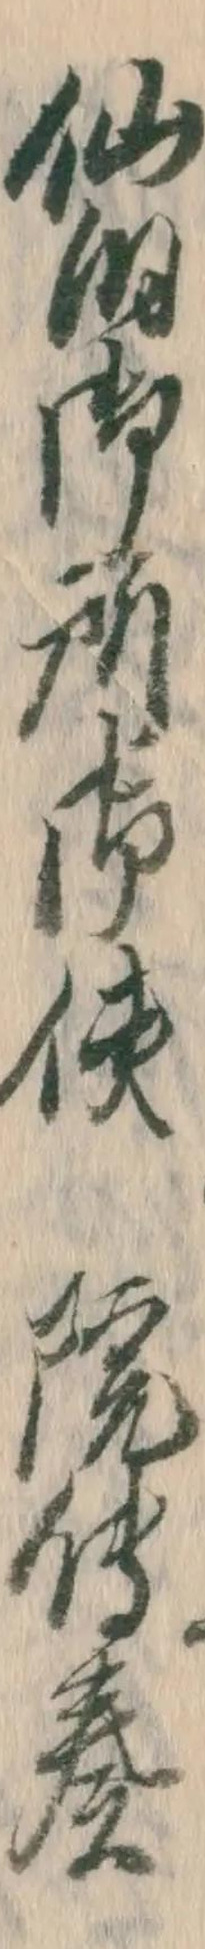仙時御所御使院傳奏
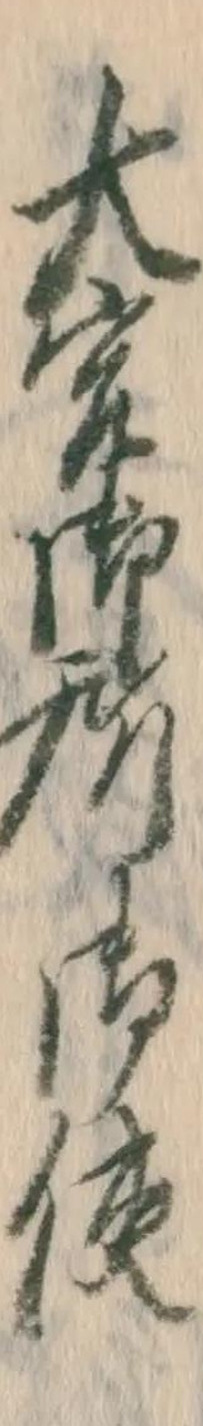大宮御所御使
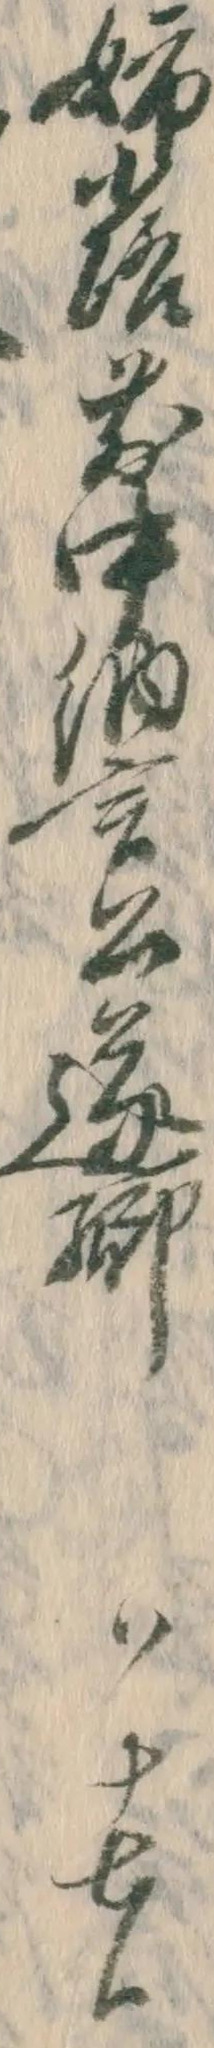姉小路前中納言公遂卿同十七日
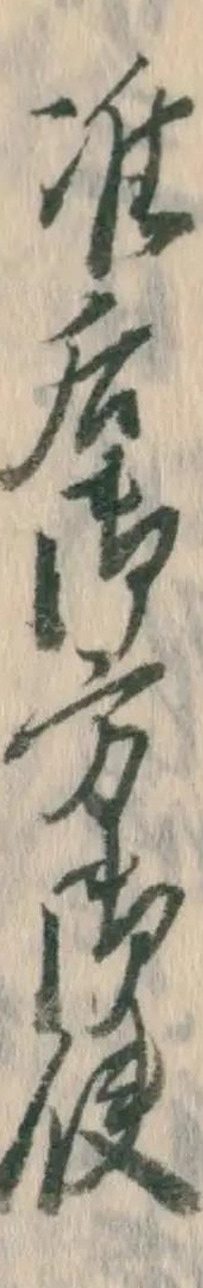准后御方御使
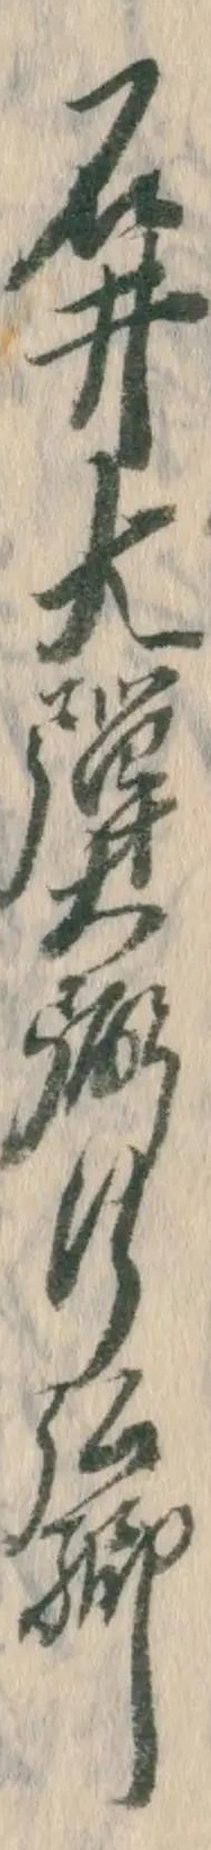石井大弾大弼行弘卿同
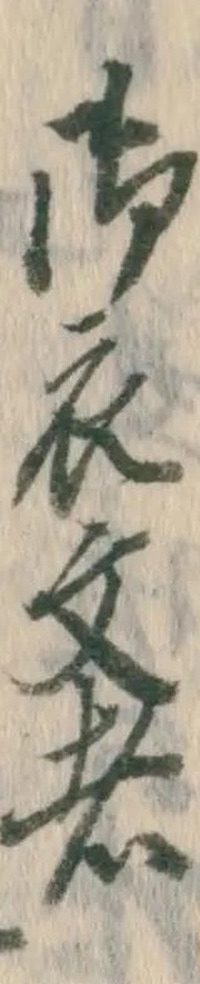御衣文者
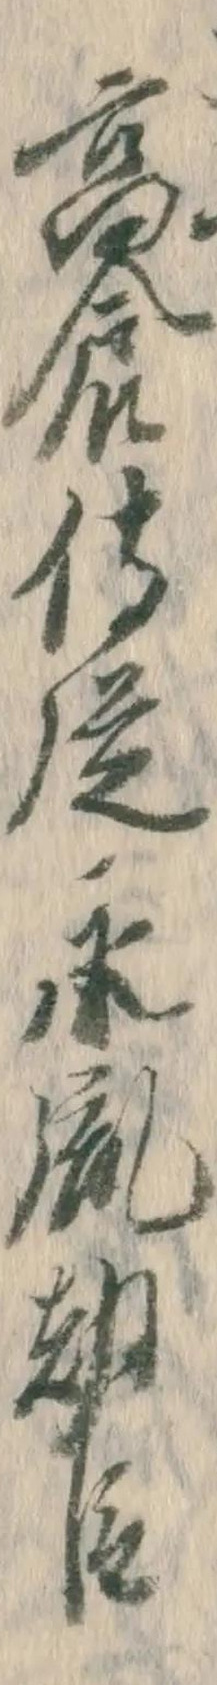高倉侍従承胤朝臣同
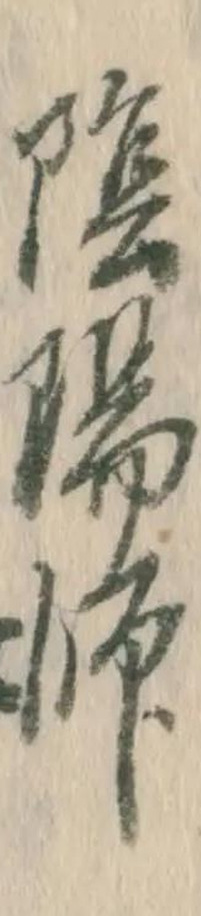陰陽師
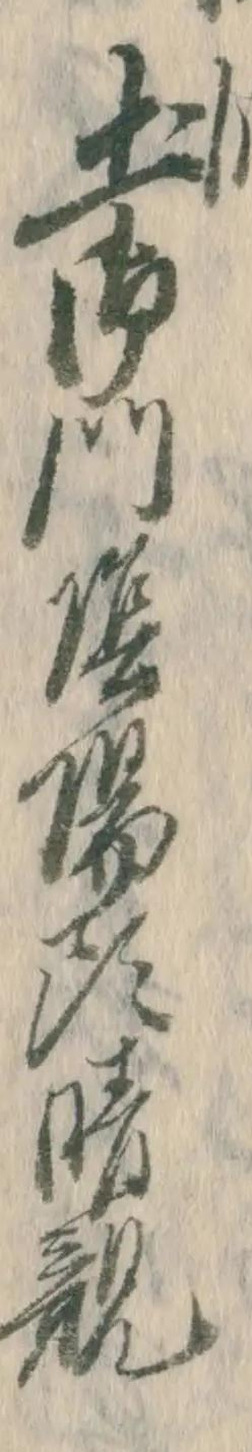土御門陰陽頭晴親同

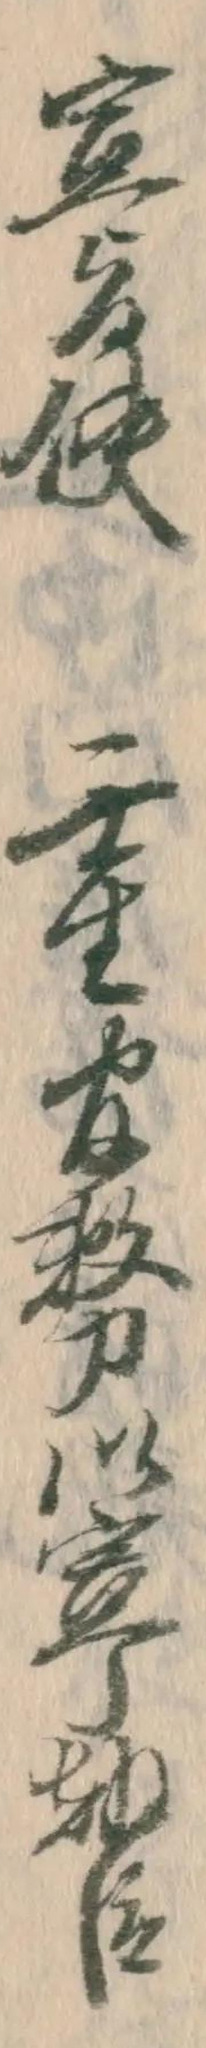宣旨使壬生官務以寧朝臣
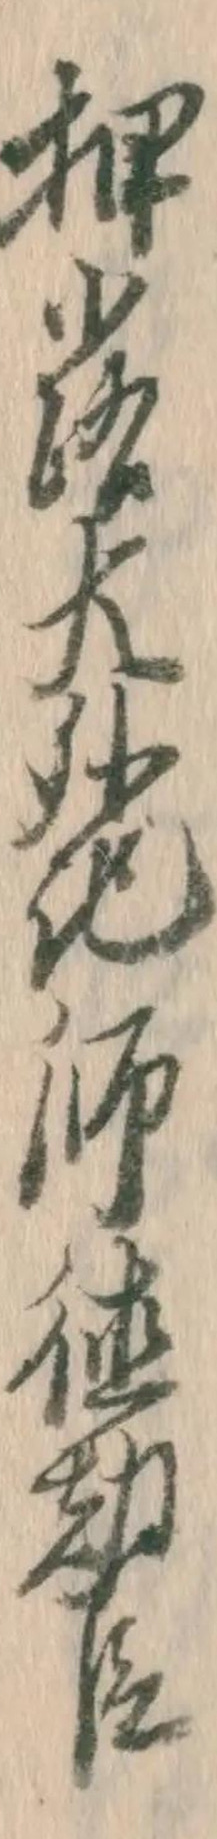押小路大外記師徳朝臣
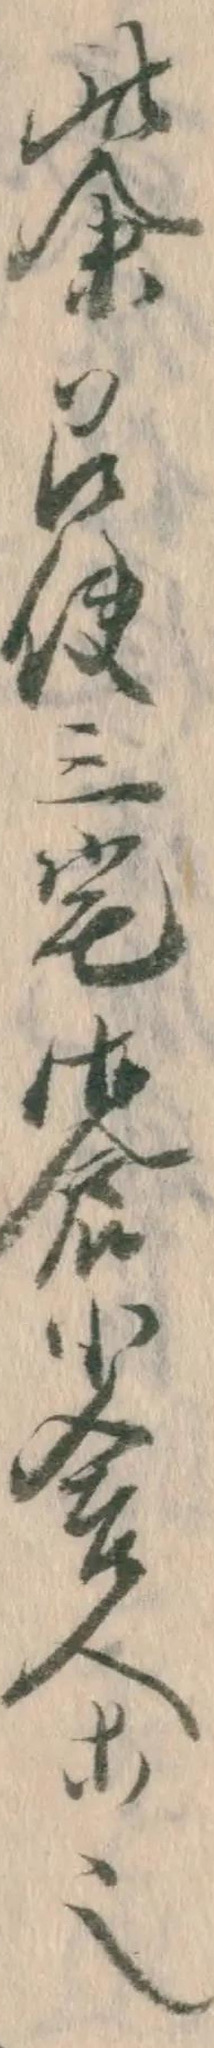此余召使三宅御倉小舎人等也
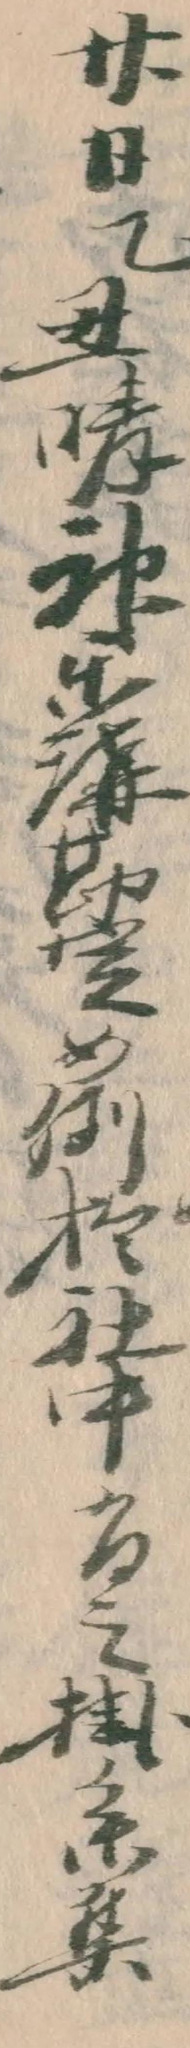廿日乙丑晴神楽講勘定如例於社中有之掛参集
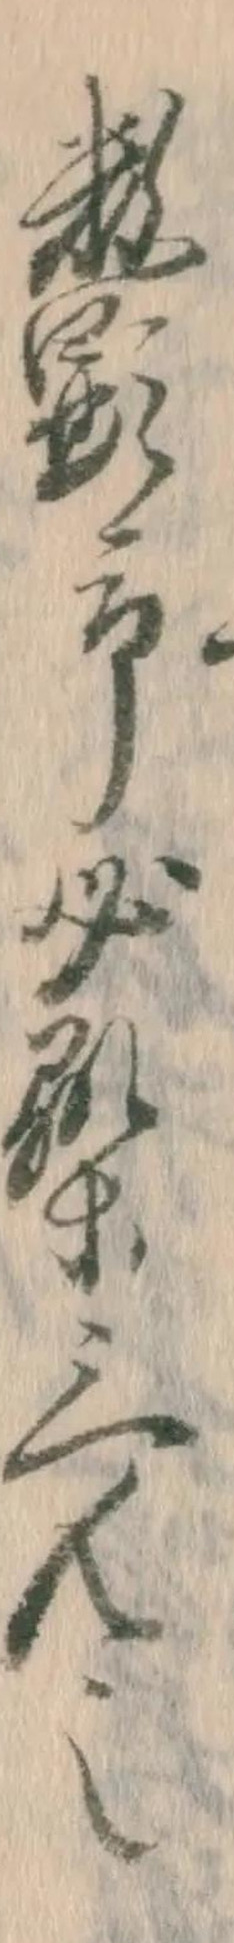数顕予必顕等三人也
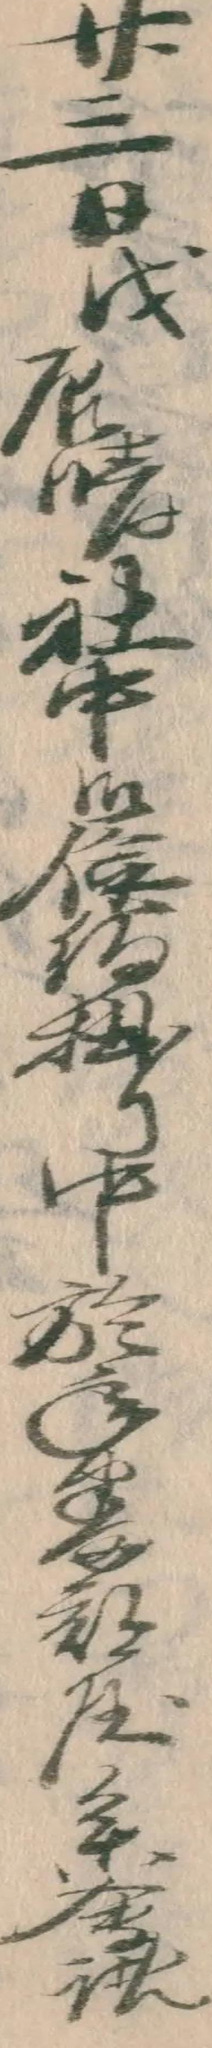廿三日戊辰晴社中御倹約掛り中於年番部屋参會諸
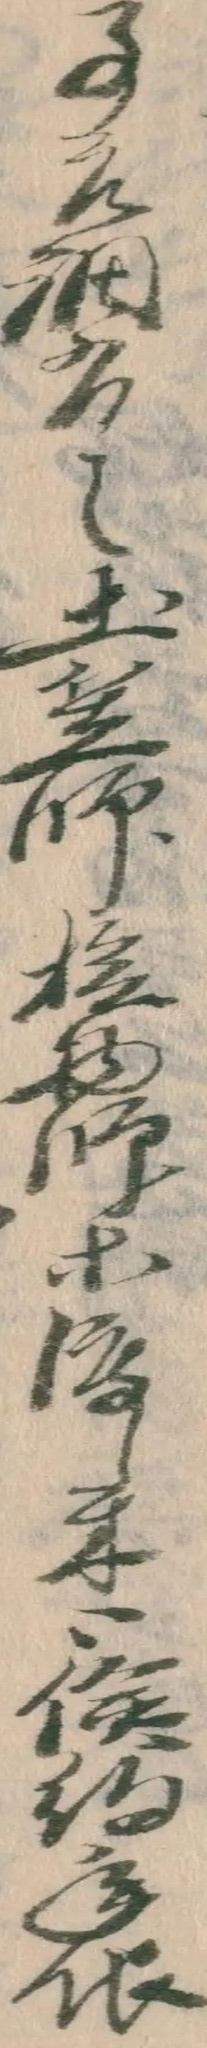事取調有之土笠師物師等渡し米御倹約年限
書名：賀茂社記録. 第67冊
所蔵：国立国会図書館 National Diet Library, JAPAN
